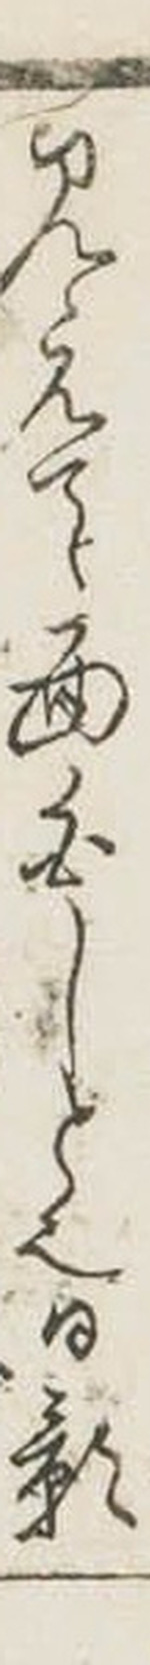見えて面白しと也日影
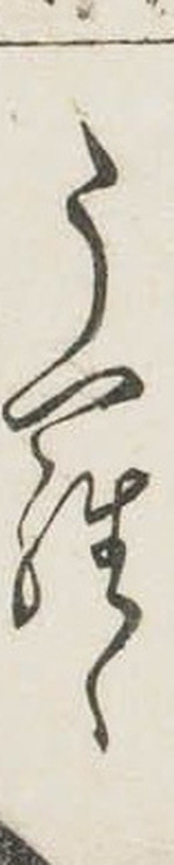うらゝ
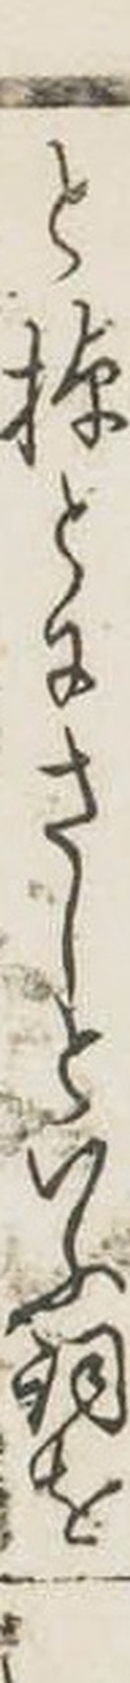と棹とにさしといふ詞を
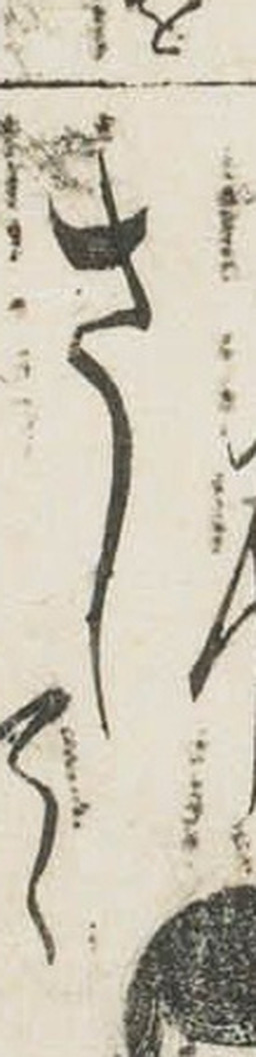さして
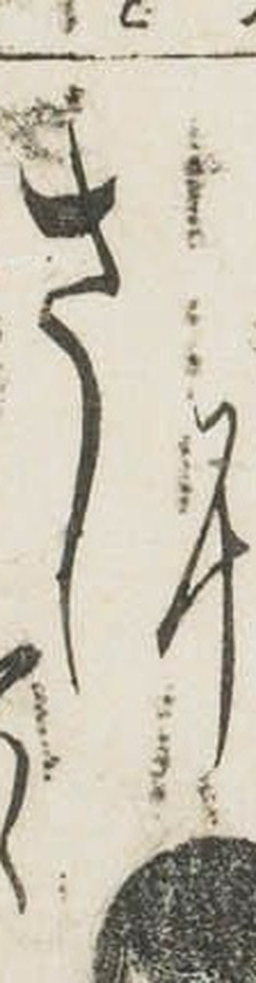さして
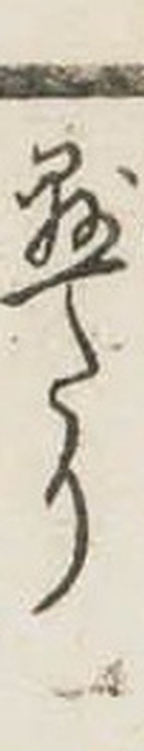懸たり
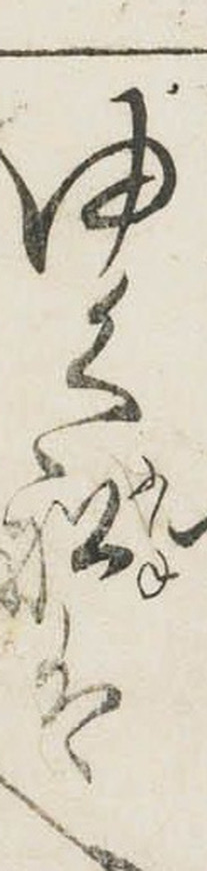ゆく船は
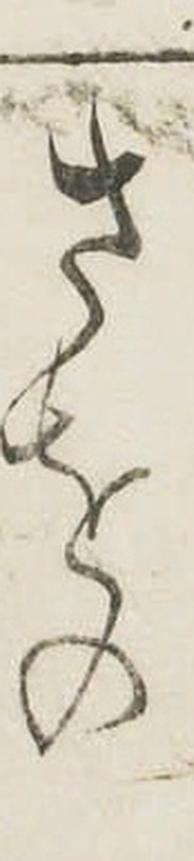さをの

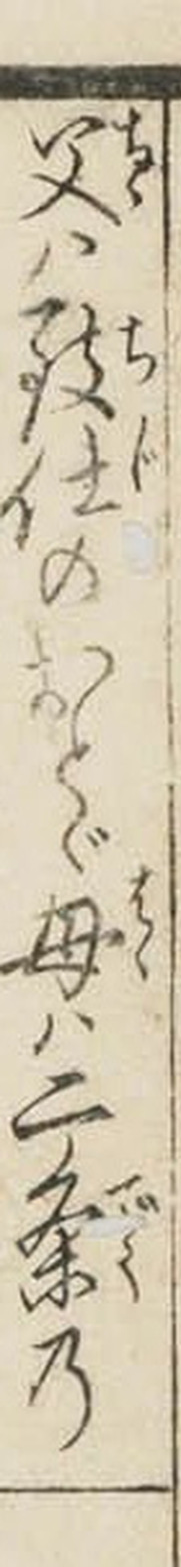父は致仕のおとゞ母は二条の
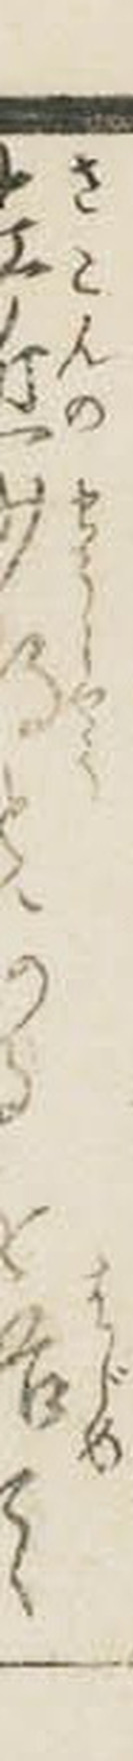左近少将とあるを始て
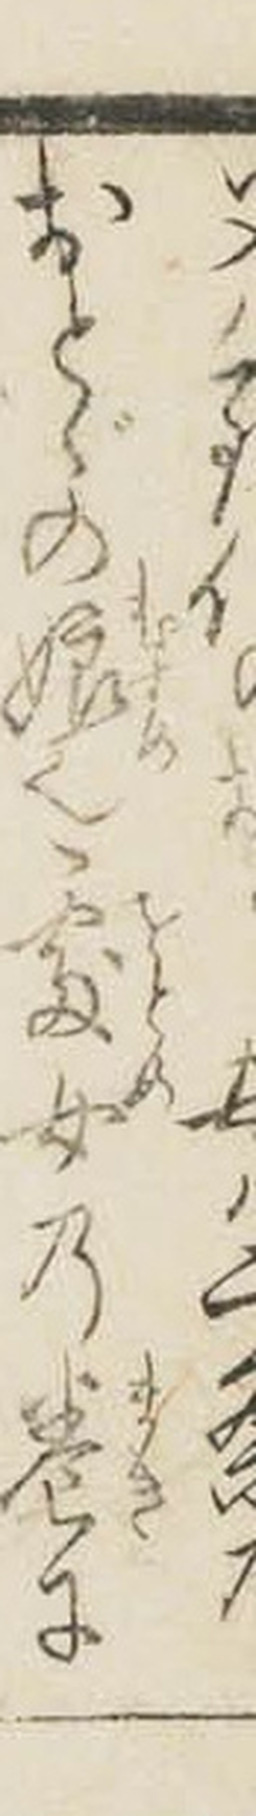おとゞの娘也処女の巻に
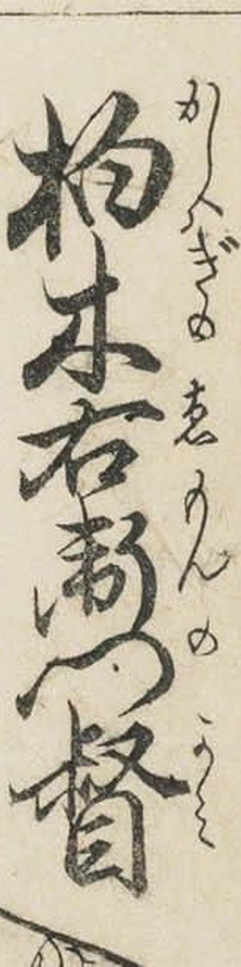柏木右衛門督
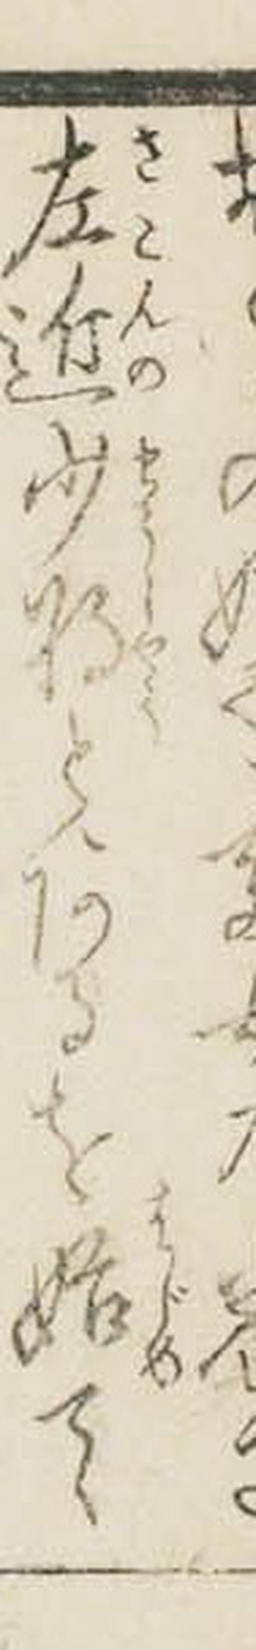左近少将とあるを始て
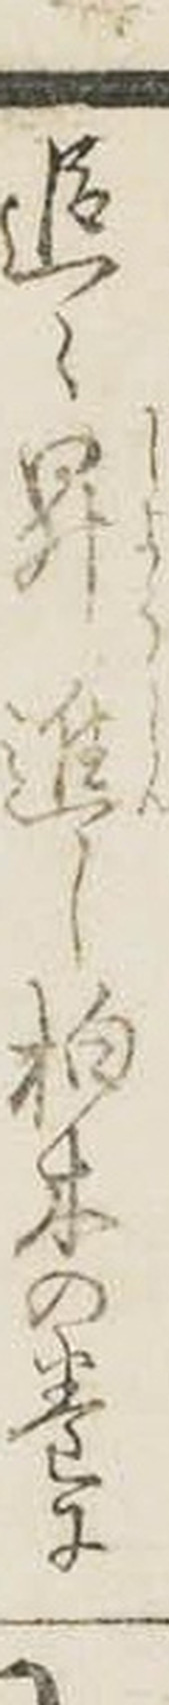追々昇進し柏木の巻に
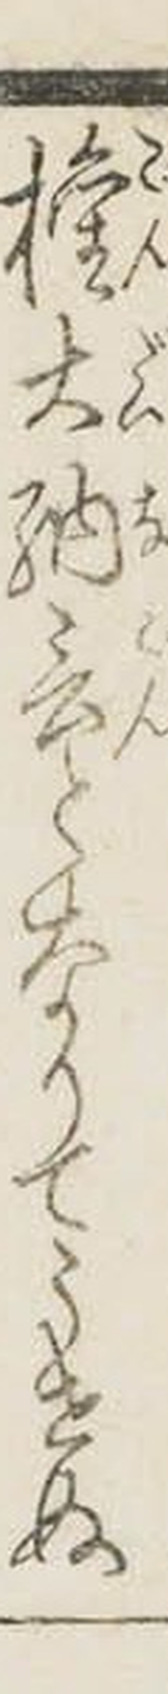権大納言となりてうせぬ
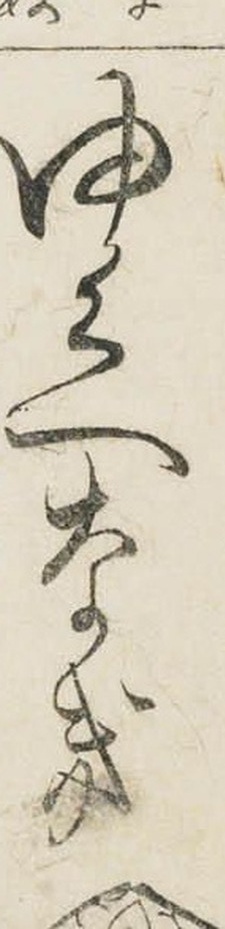ゆくへなき
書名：源氏百人一首
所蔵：東京学芸大学教育コンテンツアーカイブ
